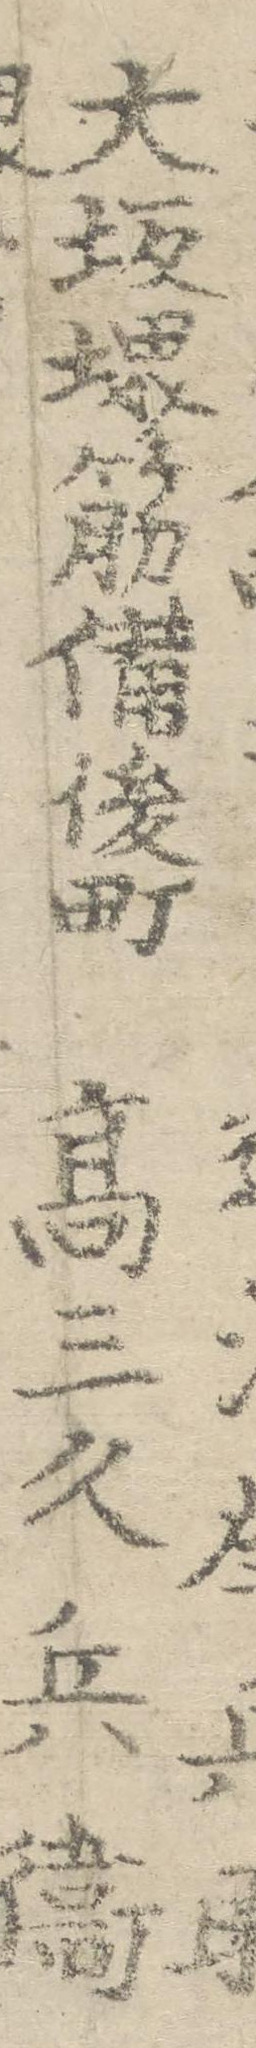大坂堺筋備後町高三久兵衛
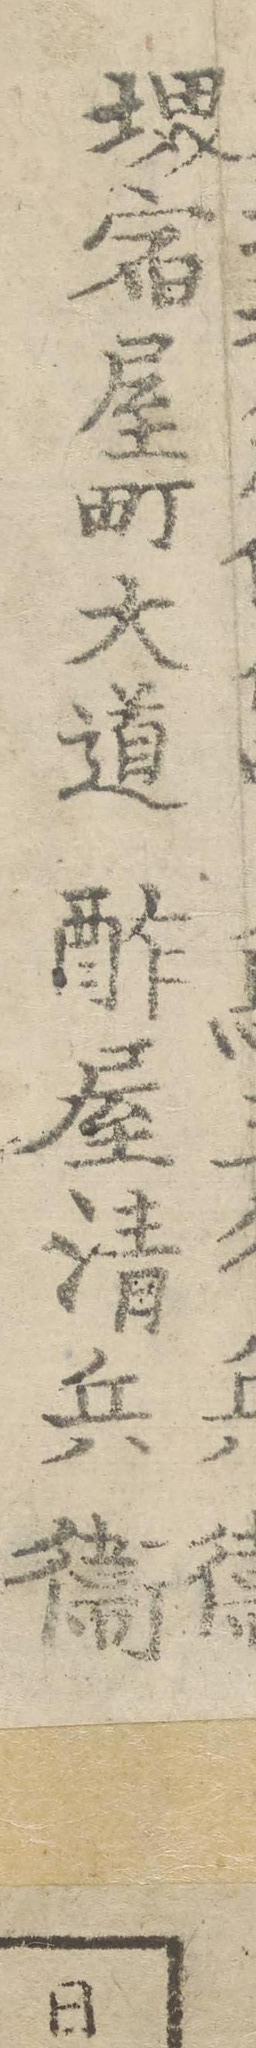堺宿屋町大道酢屋清兵衛
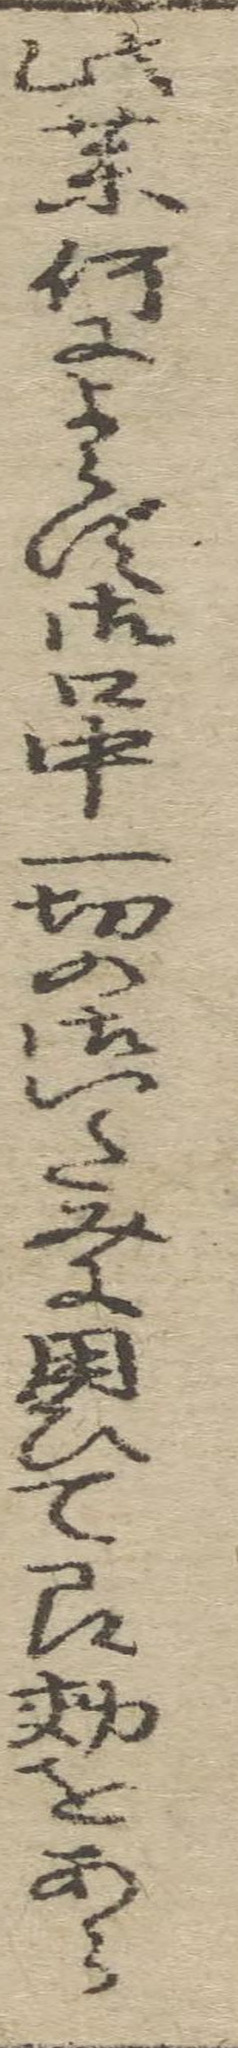此薬何によらす御口中一切の御いたみに用ひて即効をあら
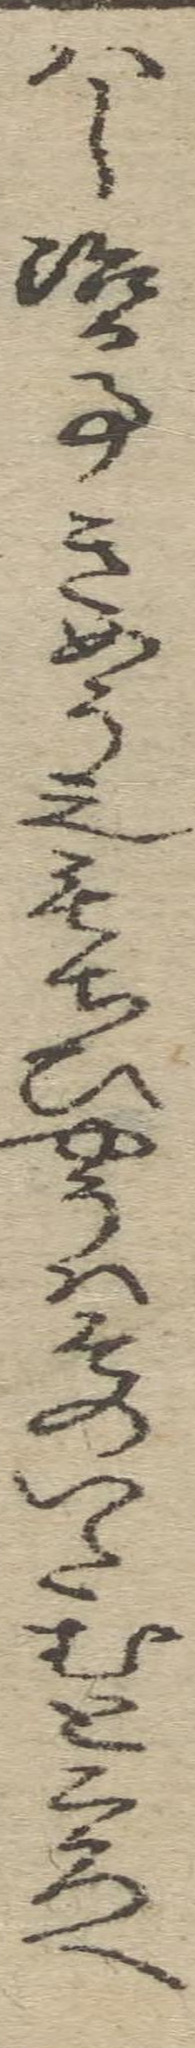はし治る事きめう也もちひやうはそのいたむところへ
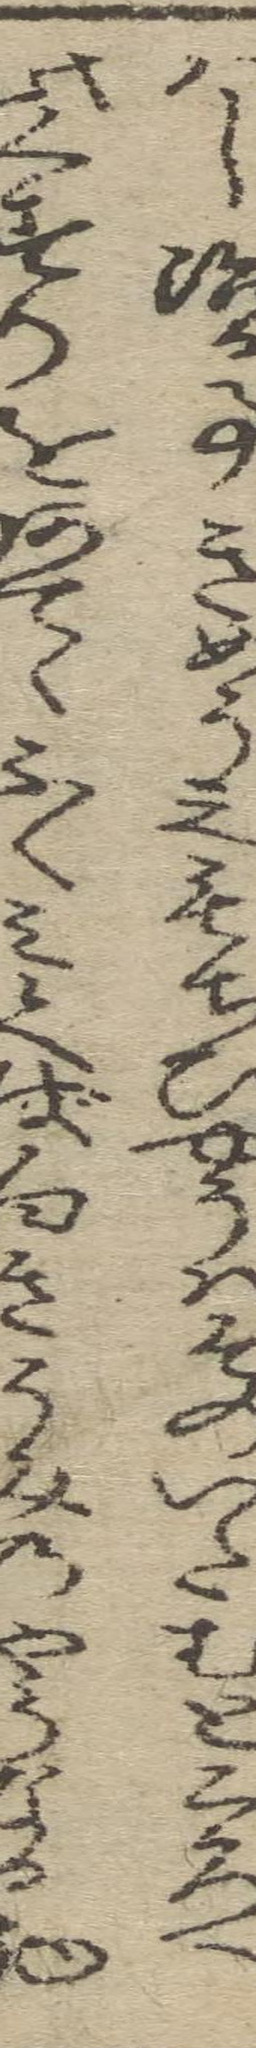此くすりをあてゝふくみ候へば白きうみのやうなる物
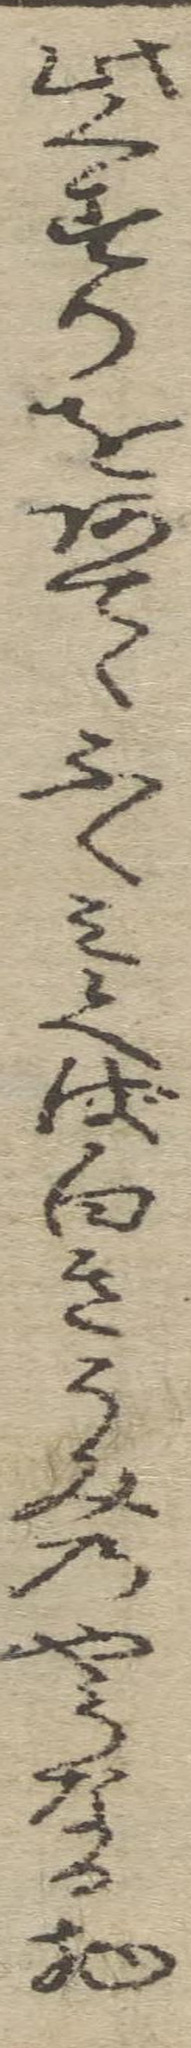此くすりをあてゝふくみ候へば白きうみのやうなる物
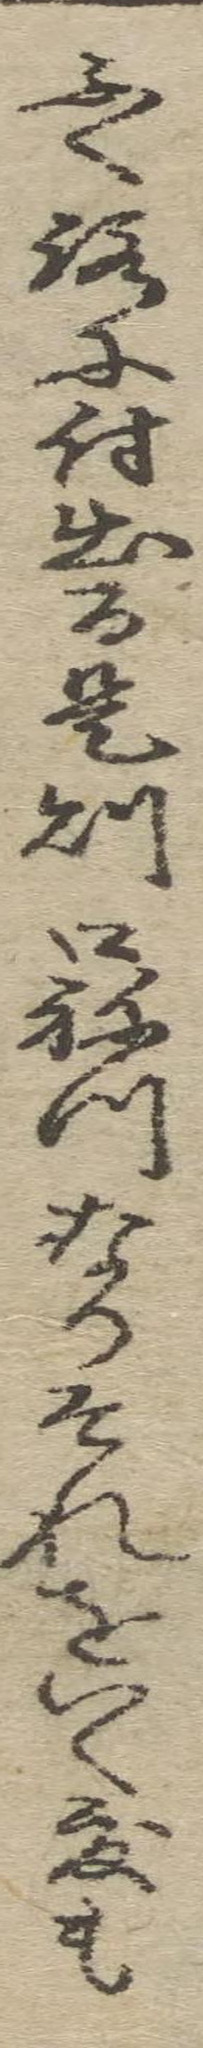ふくろに付出る是則口ねつなりそれをいく度も
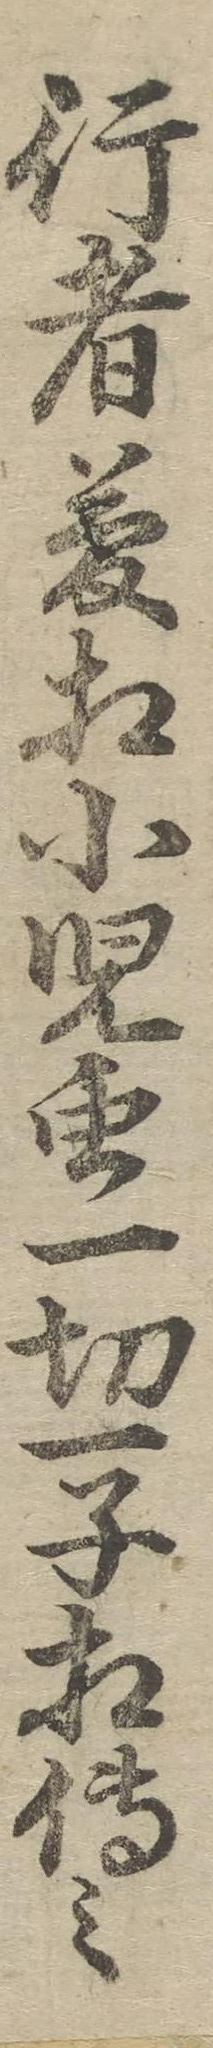行者菅相小児虫一切一子相伝之
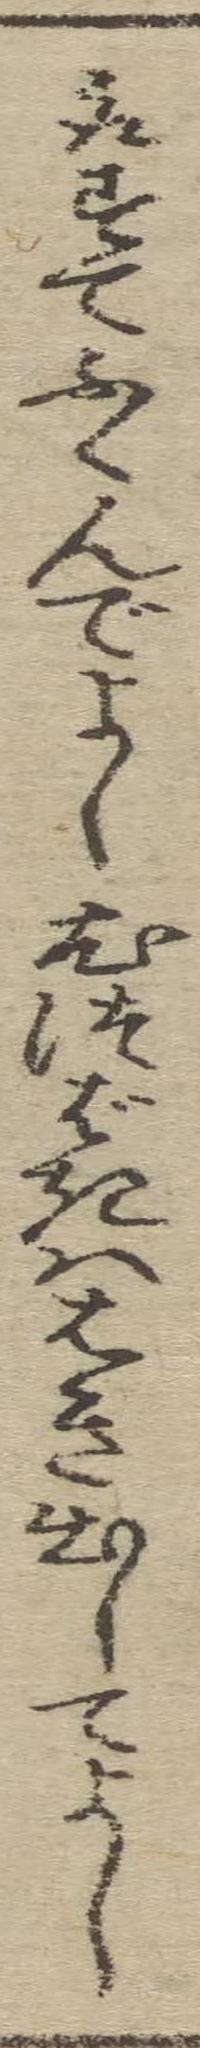取すてふくんでよし尤つばきははき出してよし
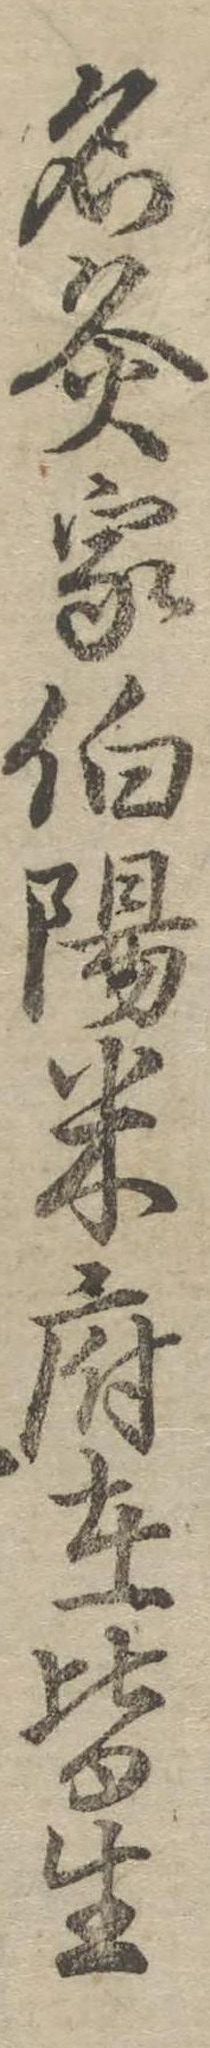名灸家伯陽米府在皆生
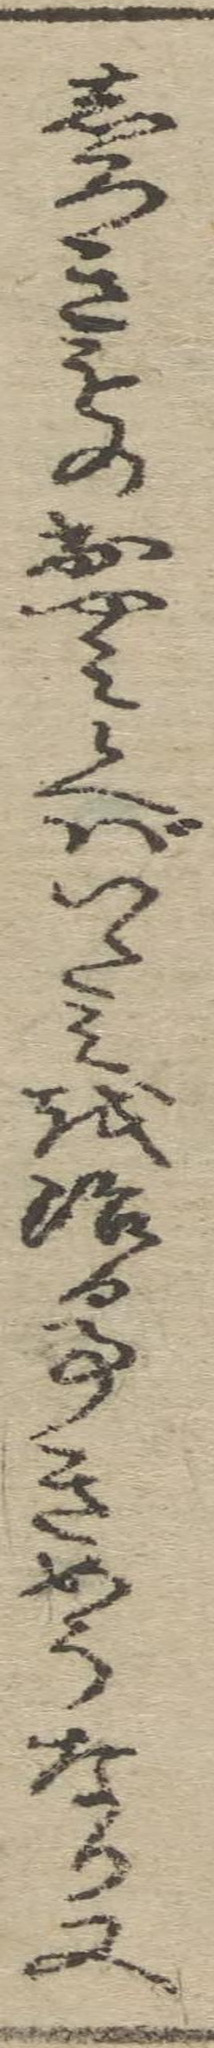しろきもの出やみ候へばいたみを治る事きめうなり又
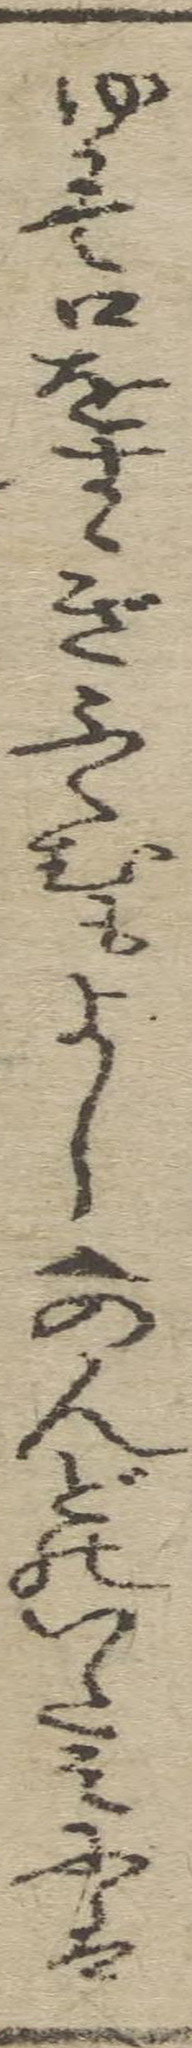ゆにて口をすゝぎふくむもよし▲のんどのいたみには
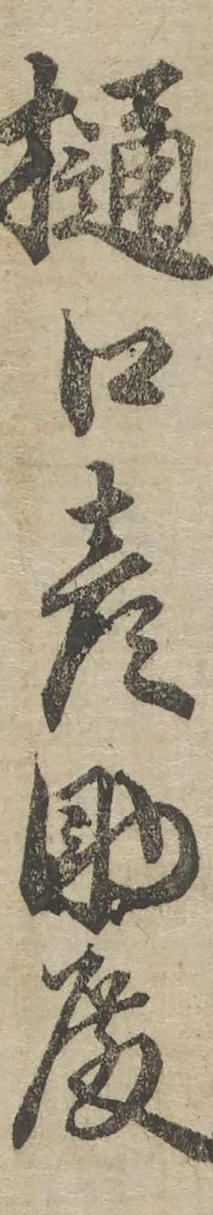樋口彦助殿
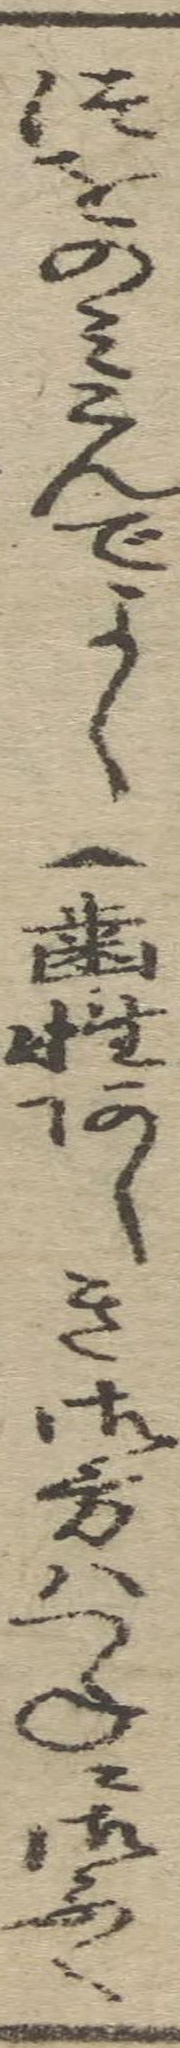つをのみこんでよし▲歯性あしき御方はつねに御ふく
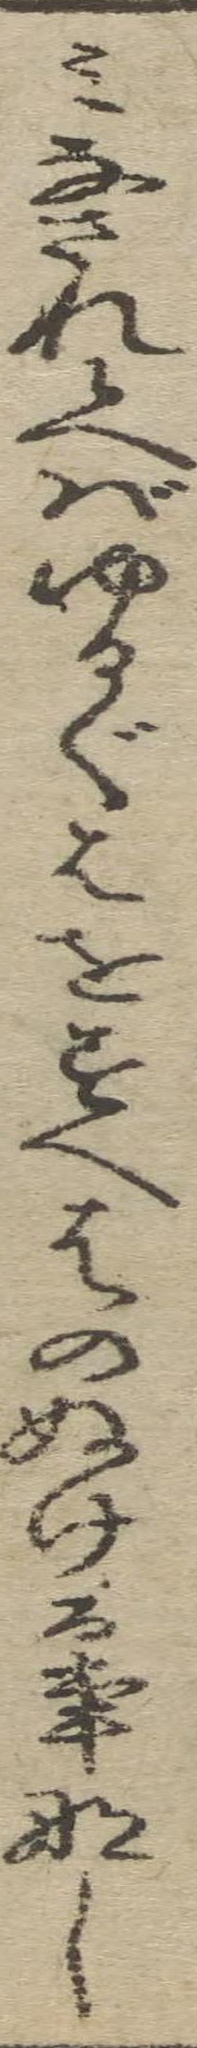みなされ候へばゆるぐはをすへはのぬける事なし
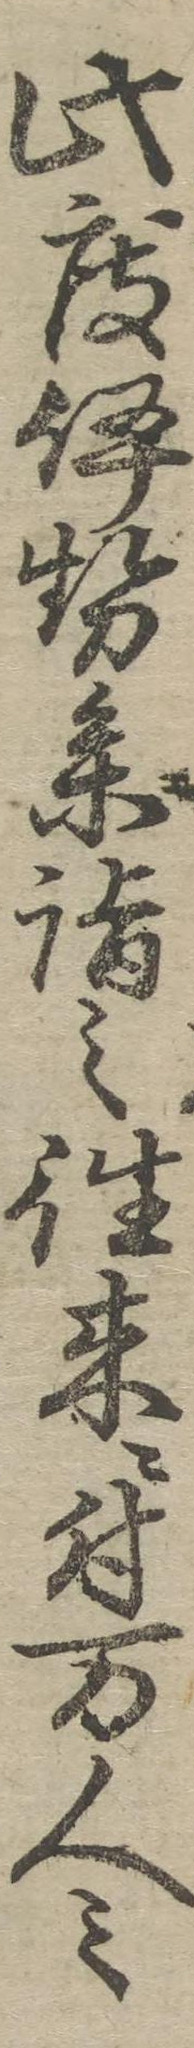此度伊勢参詣之往来に付万人み
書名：浪華薬種問屋能書張交帖. 二
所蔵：国立国会図書館 National Diet Library, JAPAN
